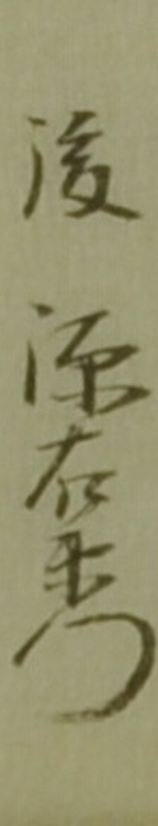後源右衛門
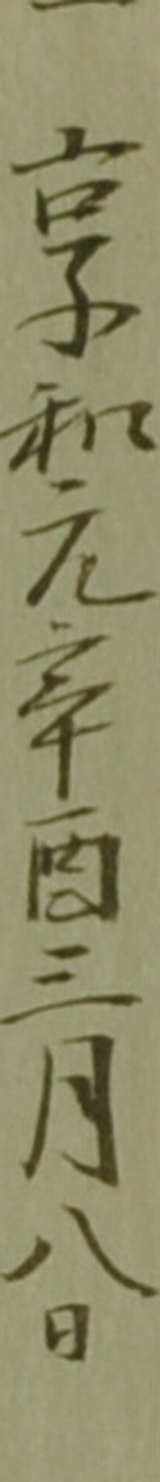一享和元辛酉三月八日
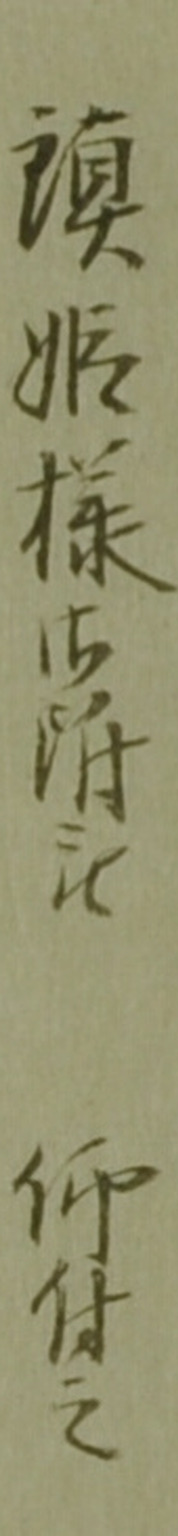鎮姫様御附被仰付之
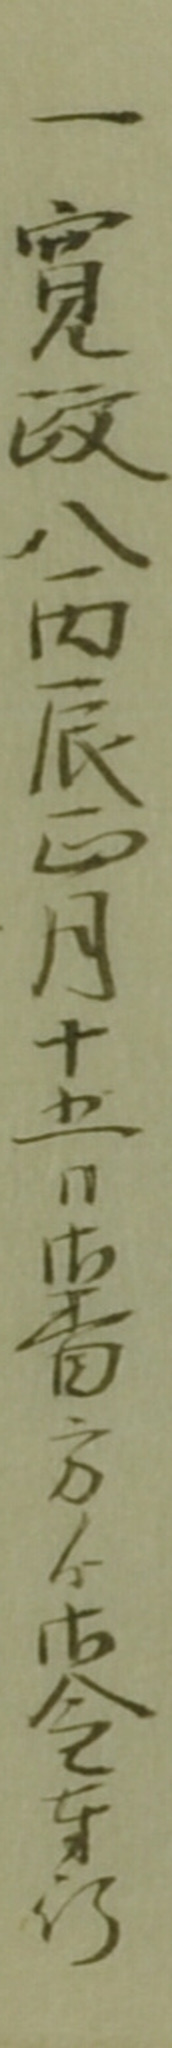一寛政八丙辰正月十五日御番方ゟ御金奉行
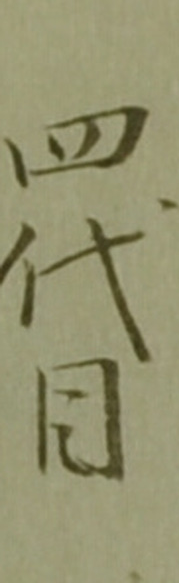四代目
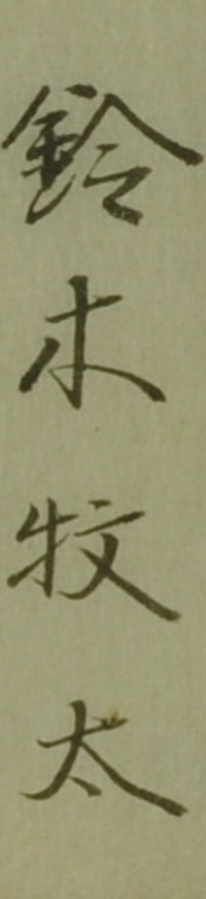鈴木牧太
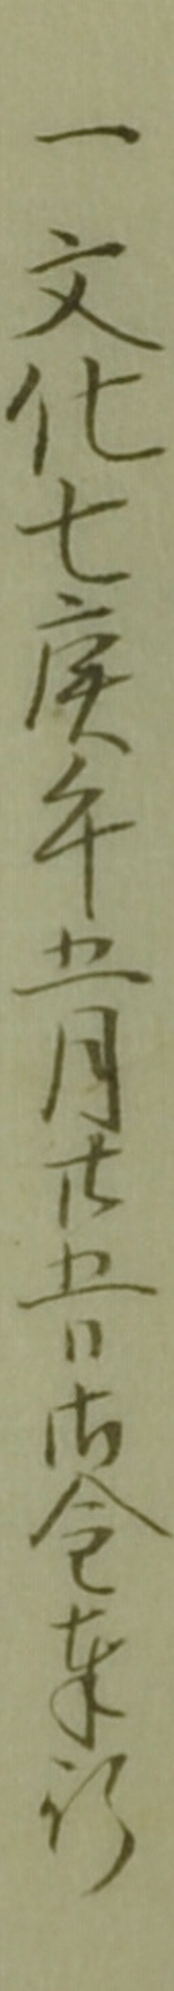一文化七庚午五月廿五日御金奉行
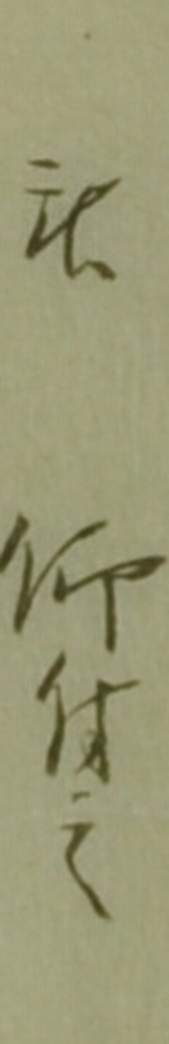被仰付之
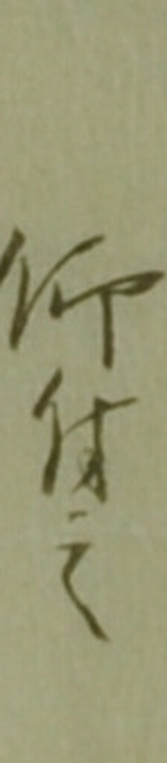仰付之
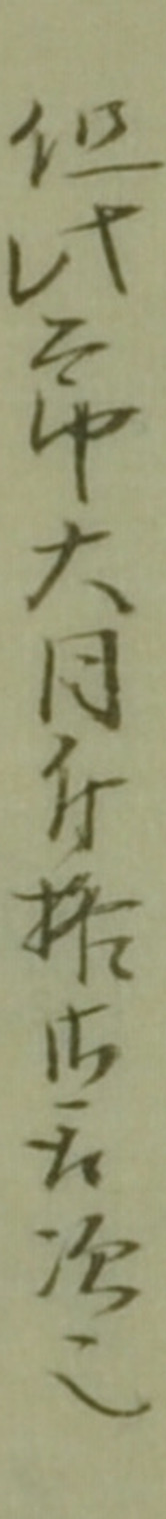但此節大目付格御取次也
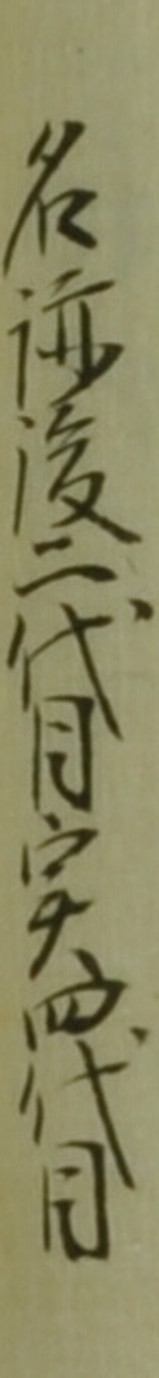名跡後二代目実四代目
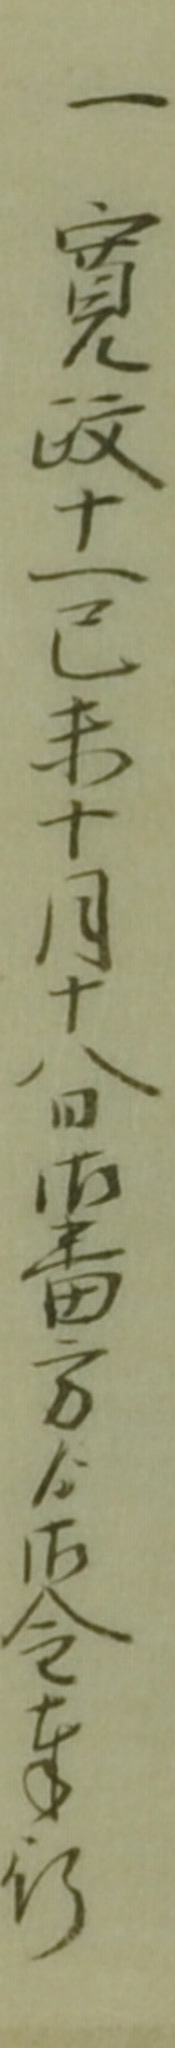一寛政十一己未十月十八日御番方ゟ御金奉行
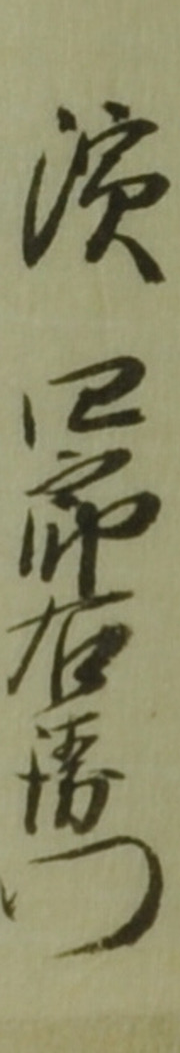濱四郎右衛門
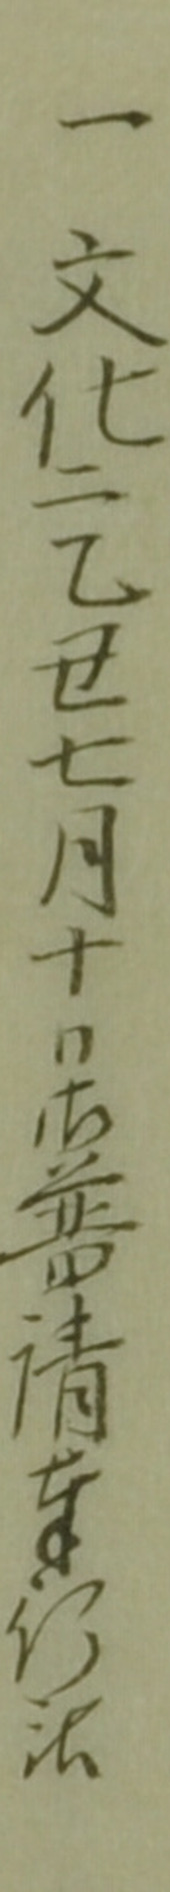一文化二乙丑七月十日御普請奉行被
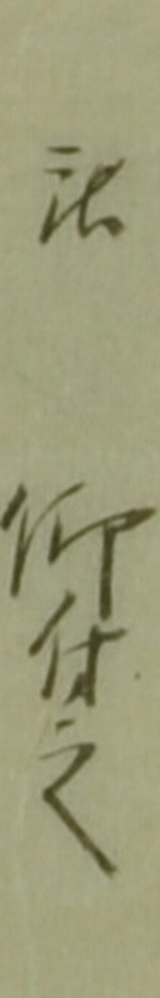被仰付之
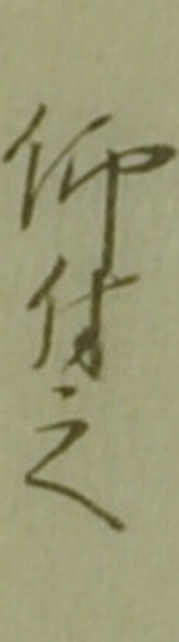仰付之
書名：諸御役代々録（七）
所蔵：伊那市立高遠町図書館・合同会社AMANE
